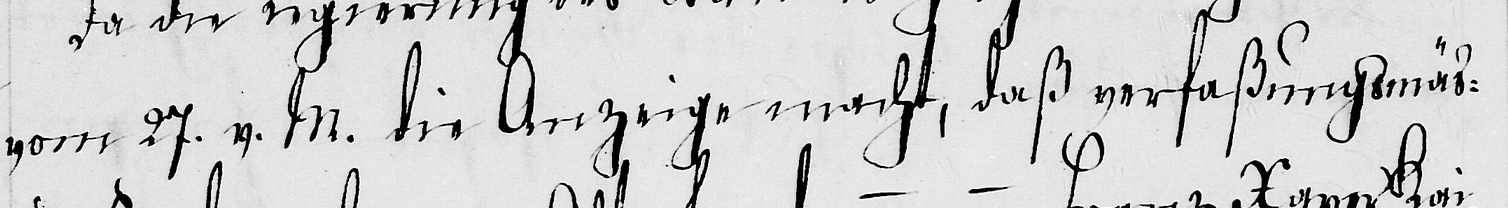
vom 27. v. M. die Anzeige macht, daß verfaßungsmäß¬
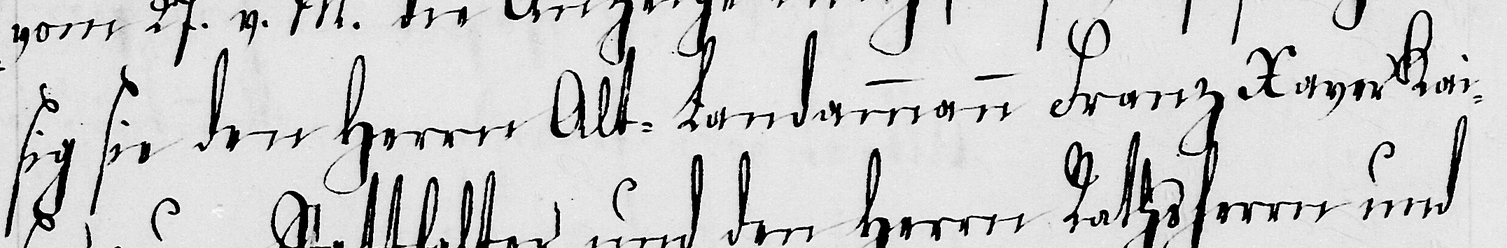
ig sie den Herrn Alt-Landammann Franz Xaver Kai¬
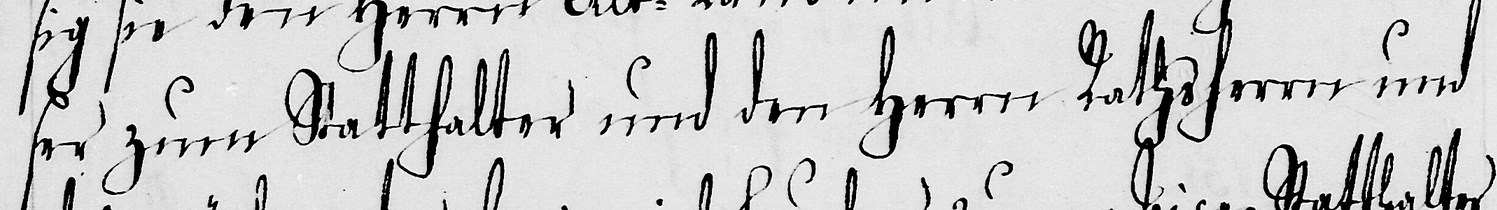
ser zum Statthalter und den Herrn Rathsherrn und
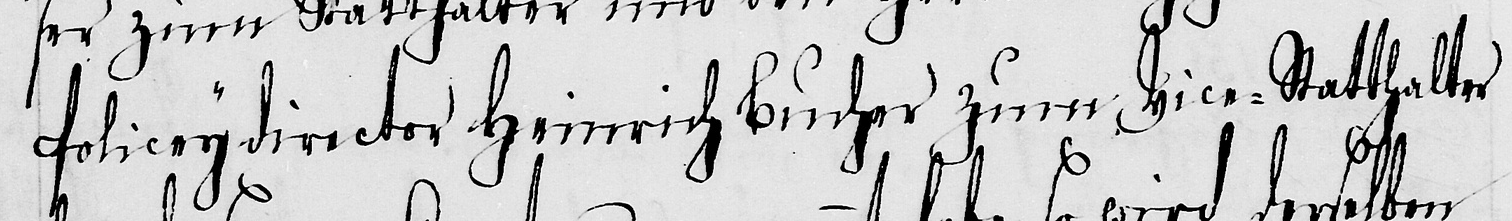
Policeydirector Heinrich Bucher zum Vice-Statthalt¬
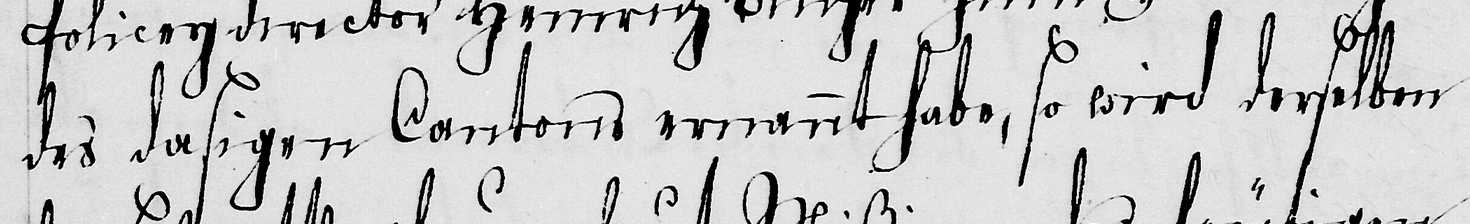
des dasigen Cantons ernannt habe, so wird derselben
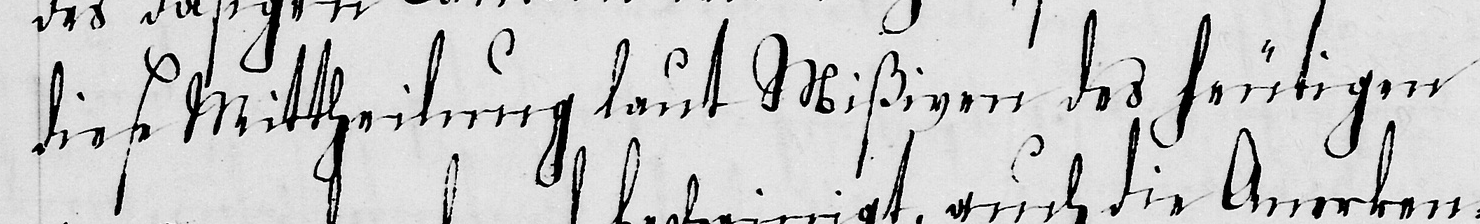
diese Mittheilung laut Mißiven des heutigen
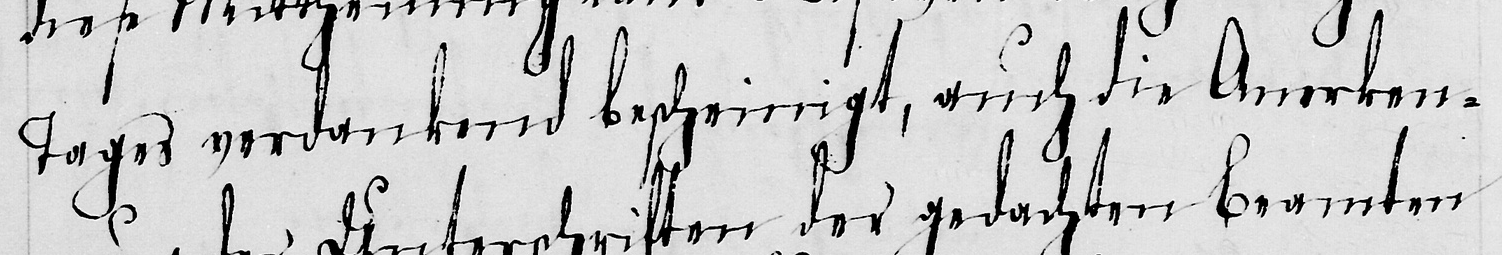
Tages verdankend bescheinigt, auch die Anerken¬
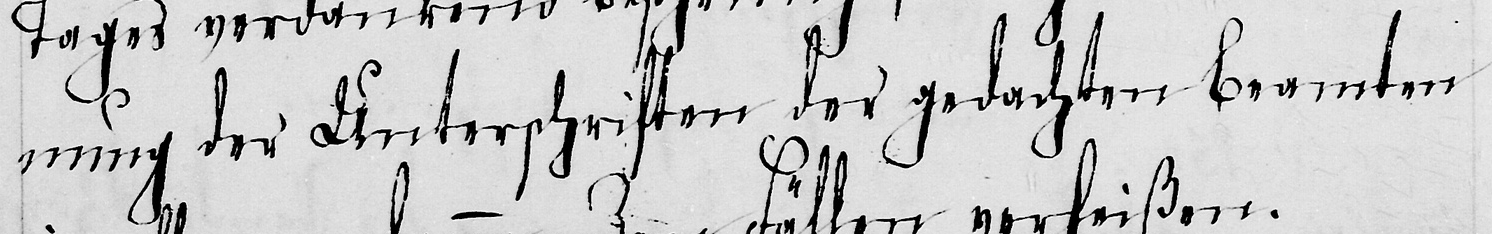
nung der Unterschriften der gedachten Beamten
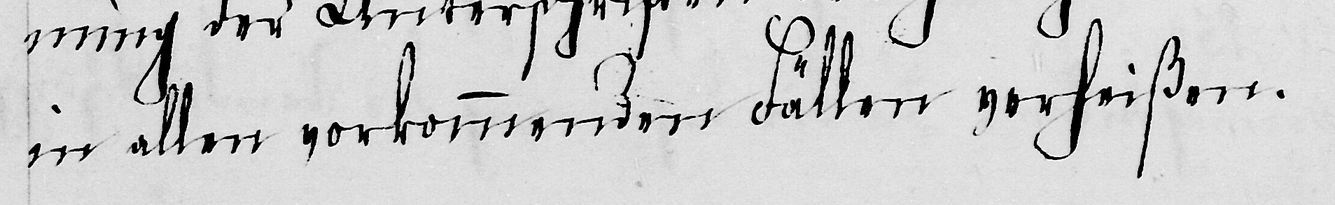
in allen vorkommenden Fällen verheißen.
